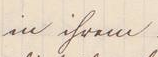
in ihrem
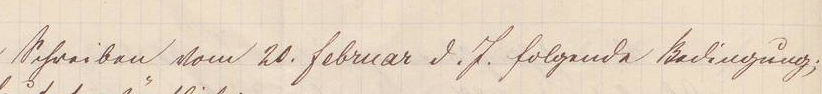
Schreiben vom 20. Februar d. J. folgende Bedingung;
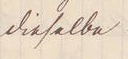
Dieselbe
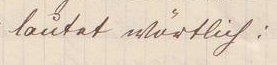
lautet wörtlich:
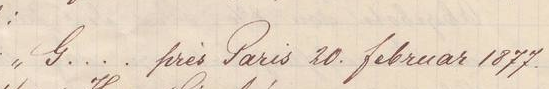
«G.... près Paris20. Februar 1877.
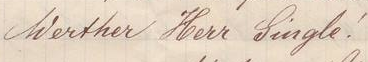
Werther Herr Single!
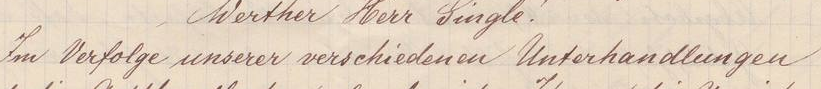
Im Verfolge unserer verschiedenen Unterhandlungen
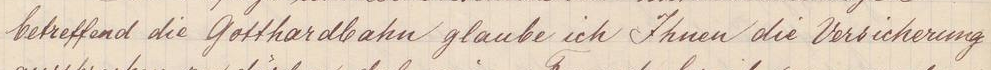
betreffend die Gotthardbahn glaube ich Ihnen die Versicherung
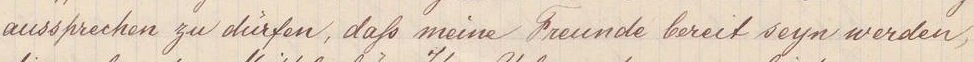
aussprechen zu dürfen, daß meine Freunde bereit seyn werden,
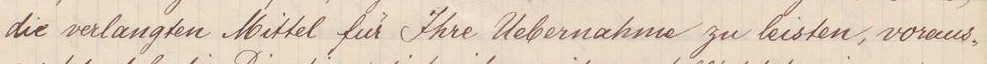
die verlangten Mittel für Ihre Uebernahme zu leisten, voraus-
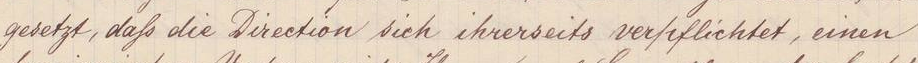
gesetzt, daß die Direction sich ihrerseits verpflichtet, einen
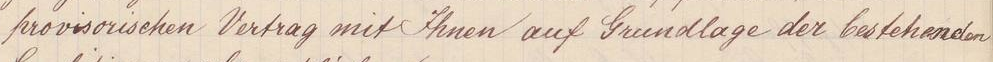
provisorischen Vertrag mit Ihnen auf Grundlage der bestehenden
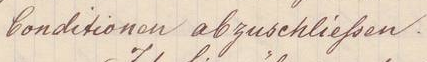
Conditionen abzuschließen.
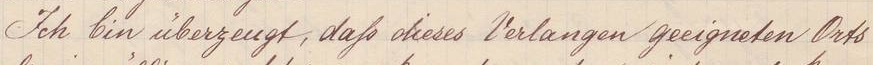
Ich bin überzeugt, daß dieses Verlangen geeigneten Orts
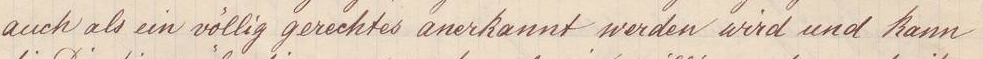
auch als ein völlig gerechtes anerkannt werden wird und kann
